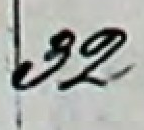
32
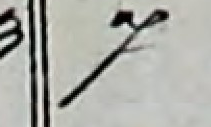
7
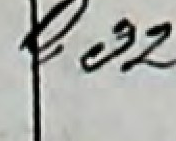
0,32
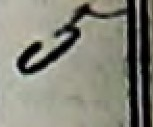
5
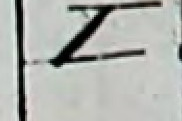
I
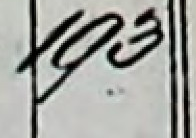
193
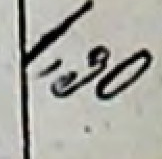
1,30
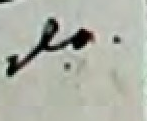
do
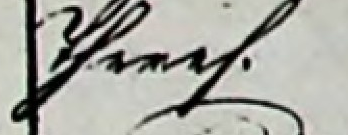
Theres.
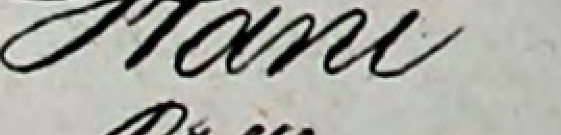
Hani
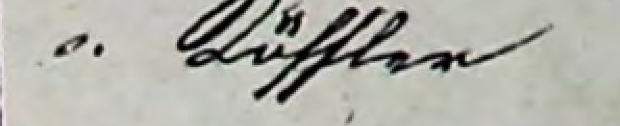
v. Kössler
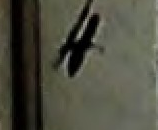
4
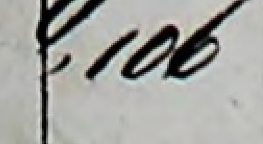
0,106
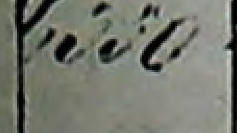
0,330
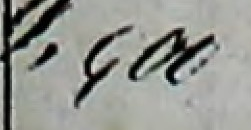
0,400
